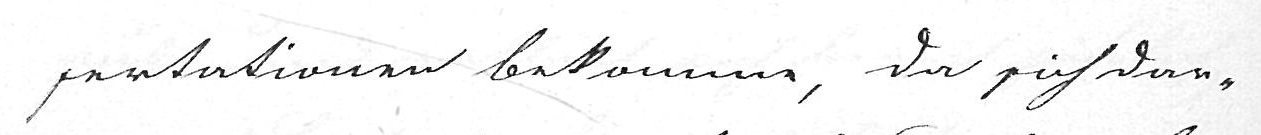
sertationen bekomme, da sich dar-
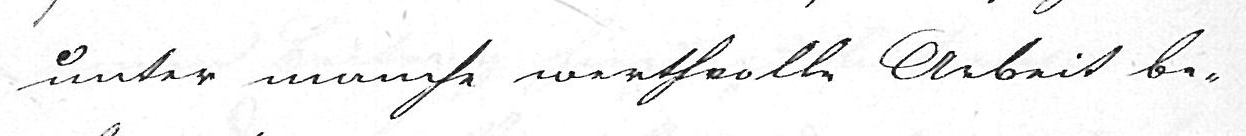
unter manche werthvolle Arbeit be-
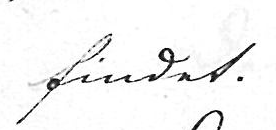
findet.
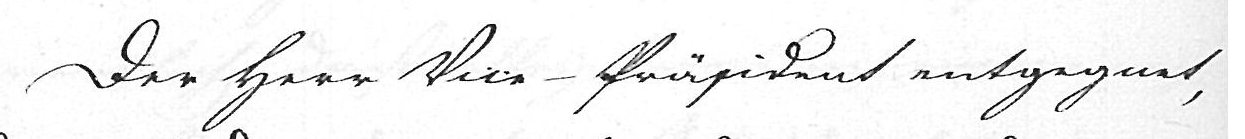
Der Herr Vice-Präsident entgegnet,
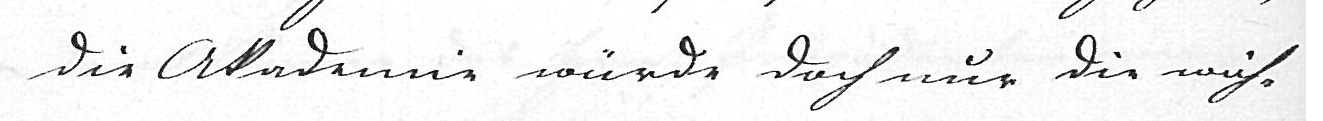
die Akademie würde doch nur die wäh-
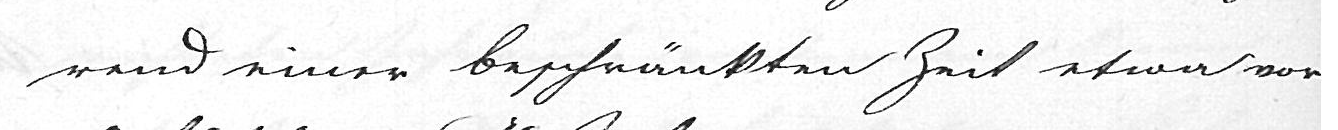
rend einer beschränkten Zeit etwa vor
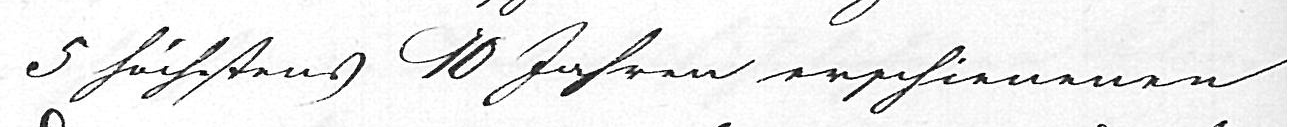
5 höchstens 10 Jahren erschienenen
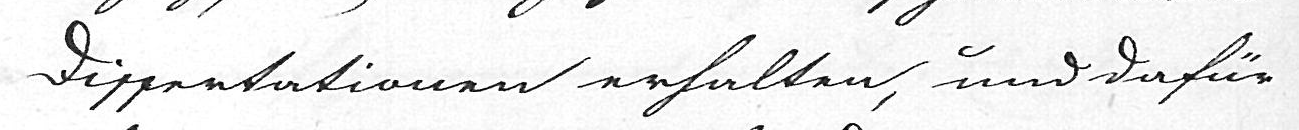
Dissertationen erhalten, und dafür
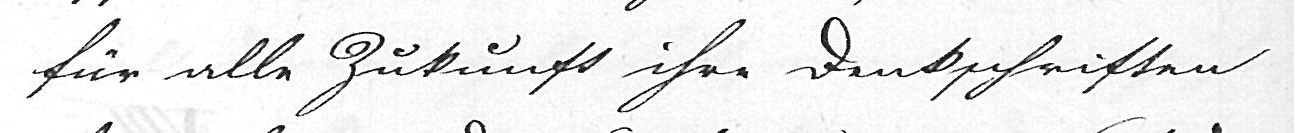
für alle Zukunft ihre Denkschriften
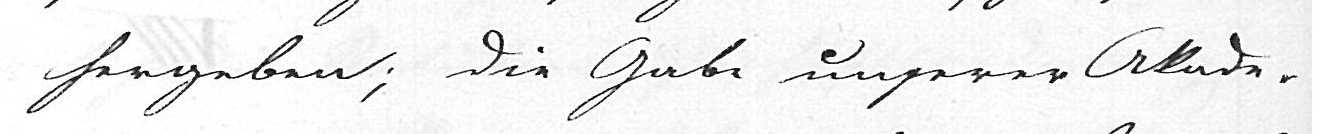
hergeben; die Gabe unserer Akade-
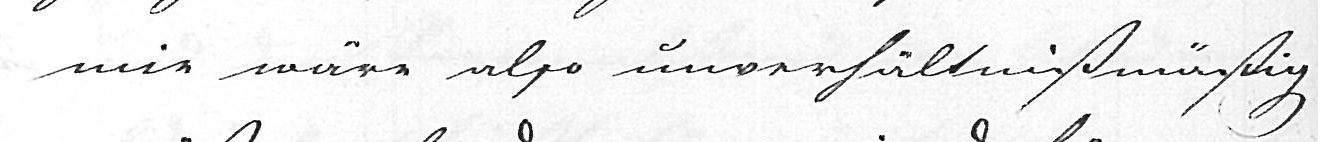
mie wäre also unverhältnißmäßig
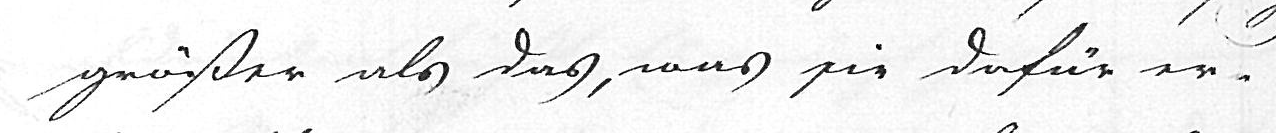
größer als das, was sie dafür er-
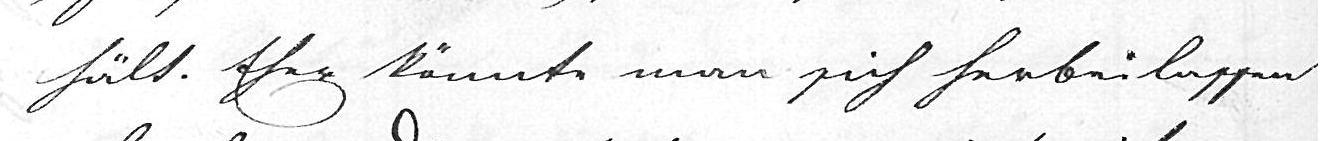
hält. Eher könnte man sich herbeilassen
